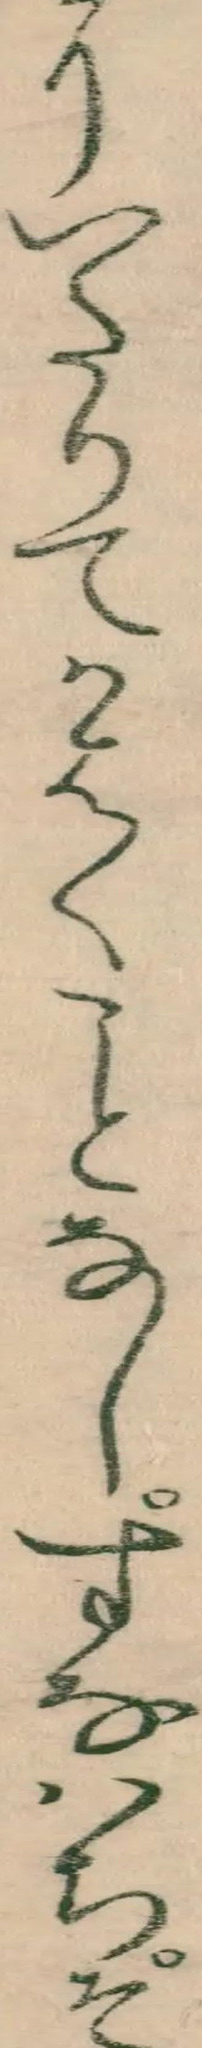にいたりてかはくことなし。すなはち。そ
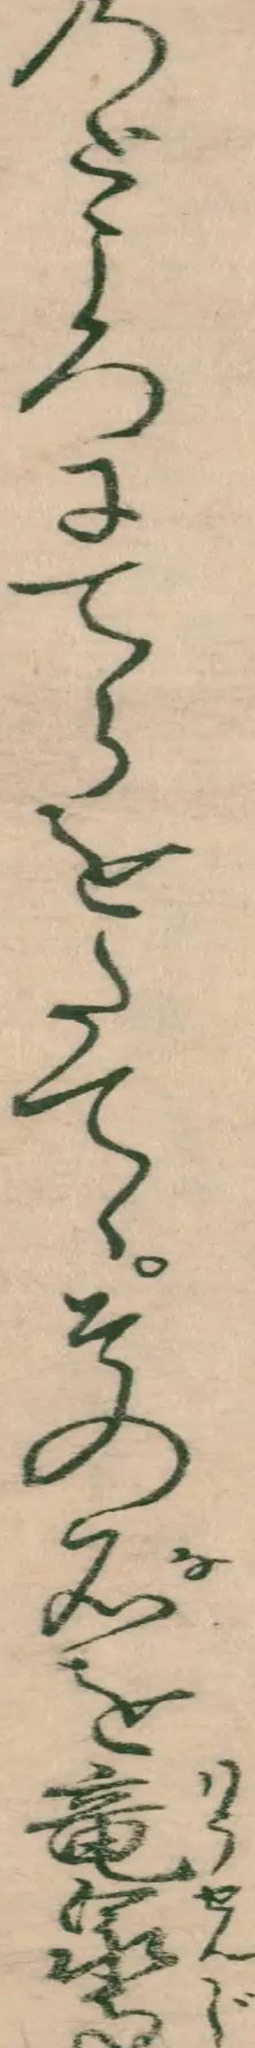のところにてらをたてゝ。その名を竜泉寺
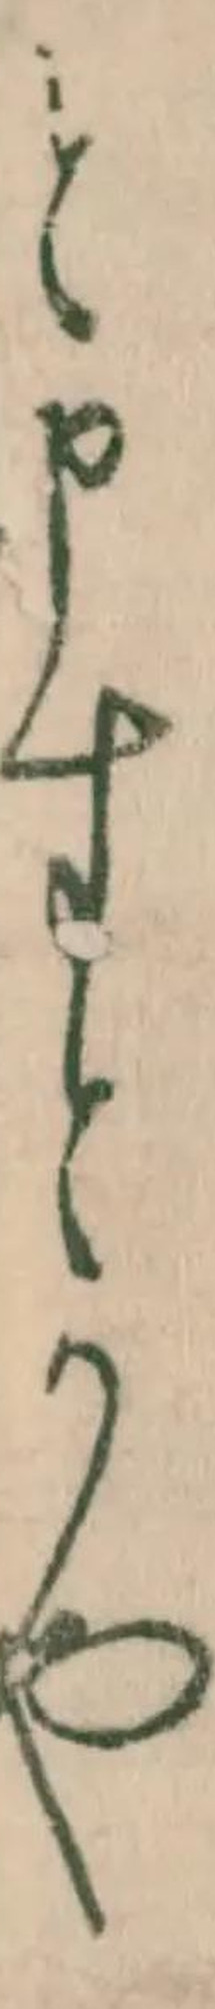と申すとかや

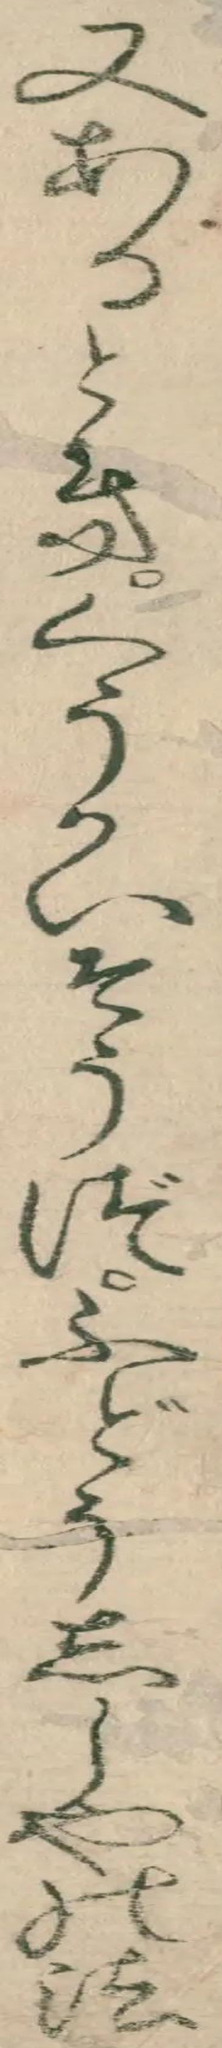又あるとき。くうかいそうづ。ふどうししやの法
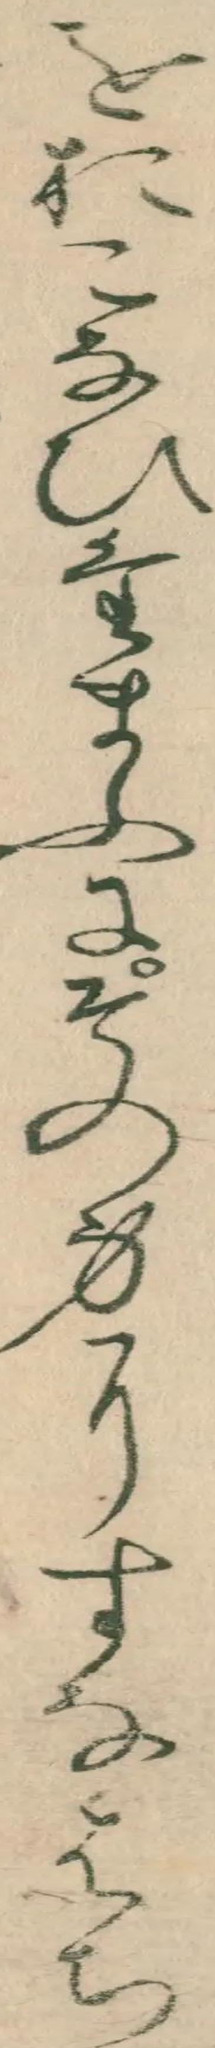をおこなひたまふ。その身にすなはち
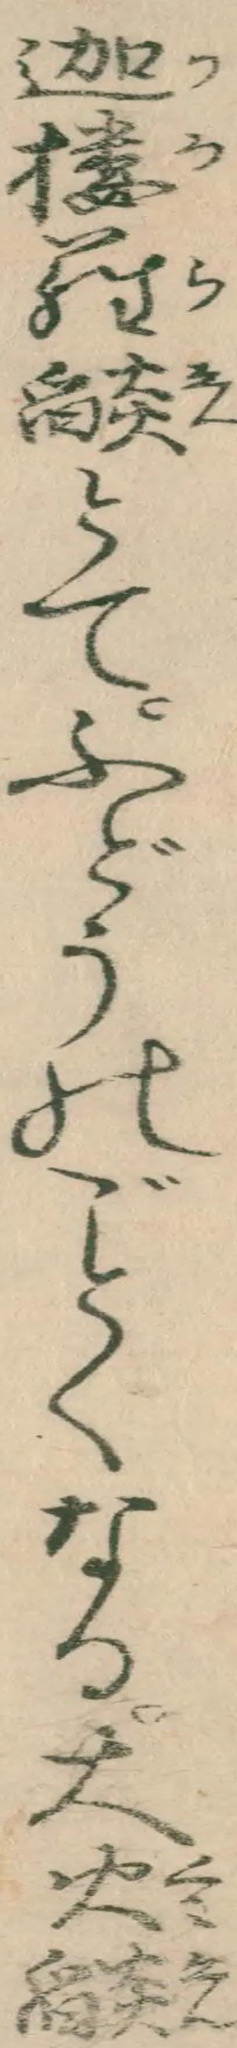迦楼羅焔とて。ふどうのごとくなる。大火焔
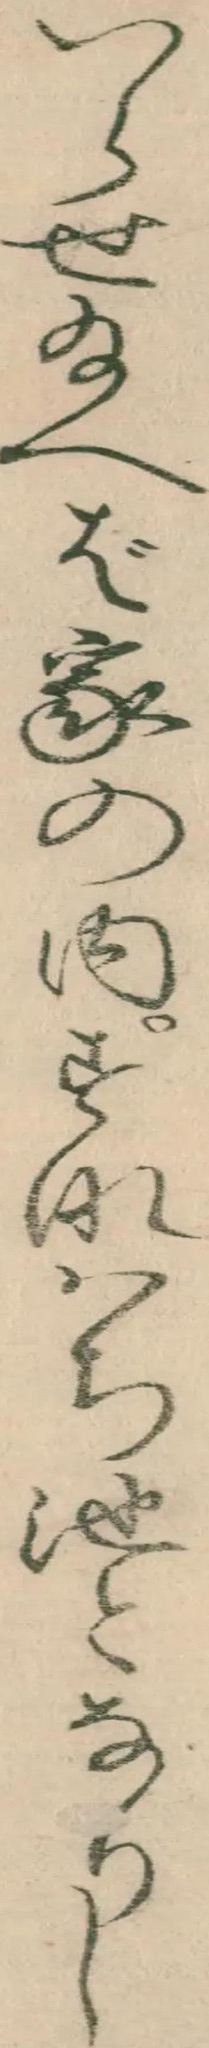いらせ給へば家の内。すなはち池となりし
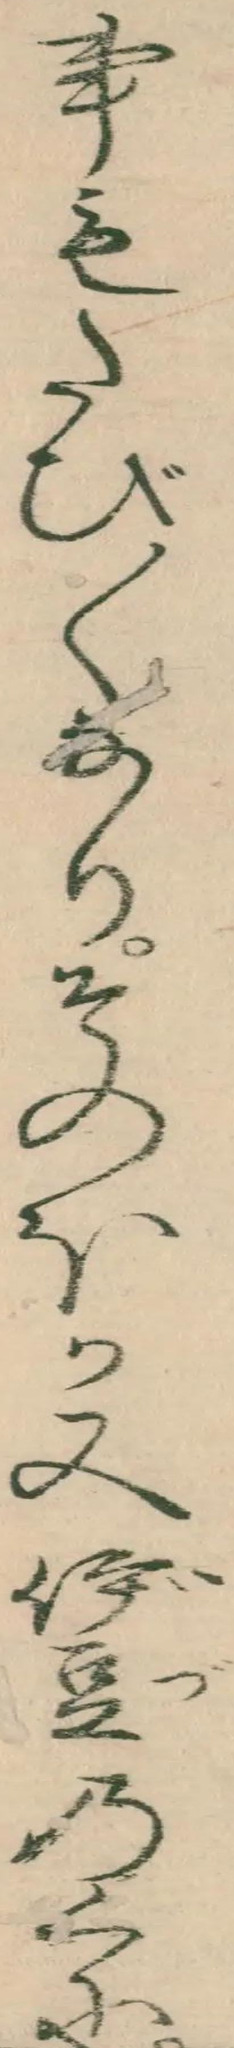事もたび〳〵なり。そのほか又伊豆のくに。
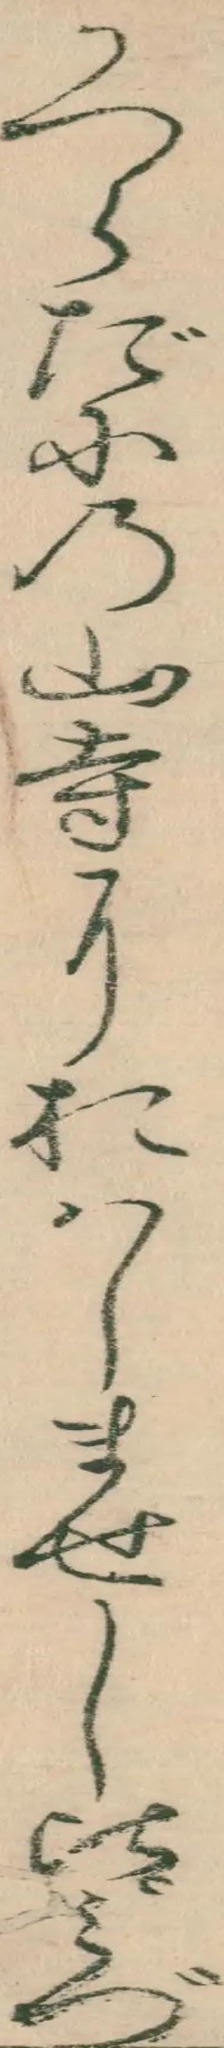かつらだにの山寺におはしませし頃。みづ
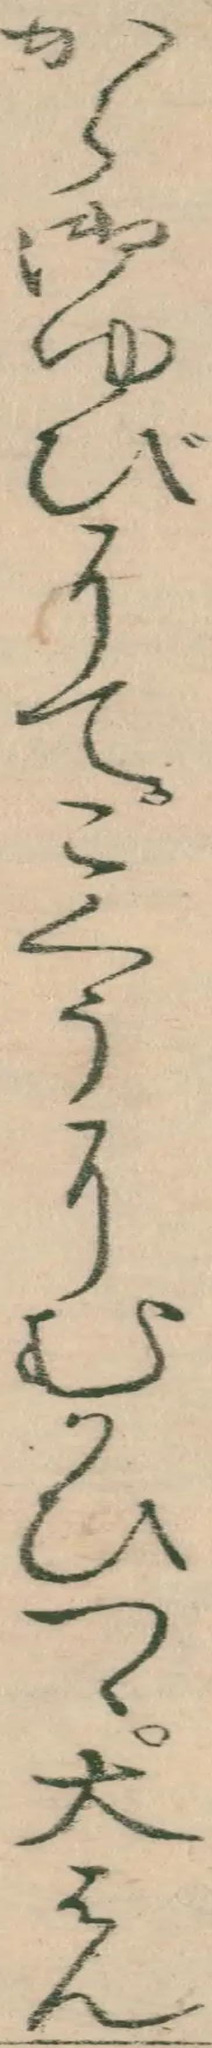から御ゆびにて。虚空にむかひて。大はん
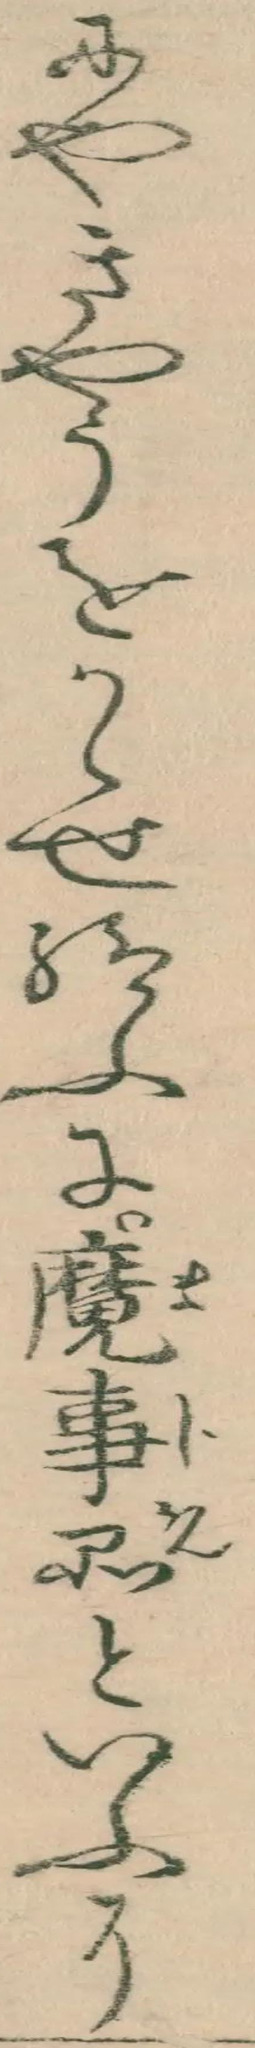にやきやうをかゝせ給ふに。魔事品といふに
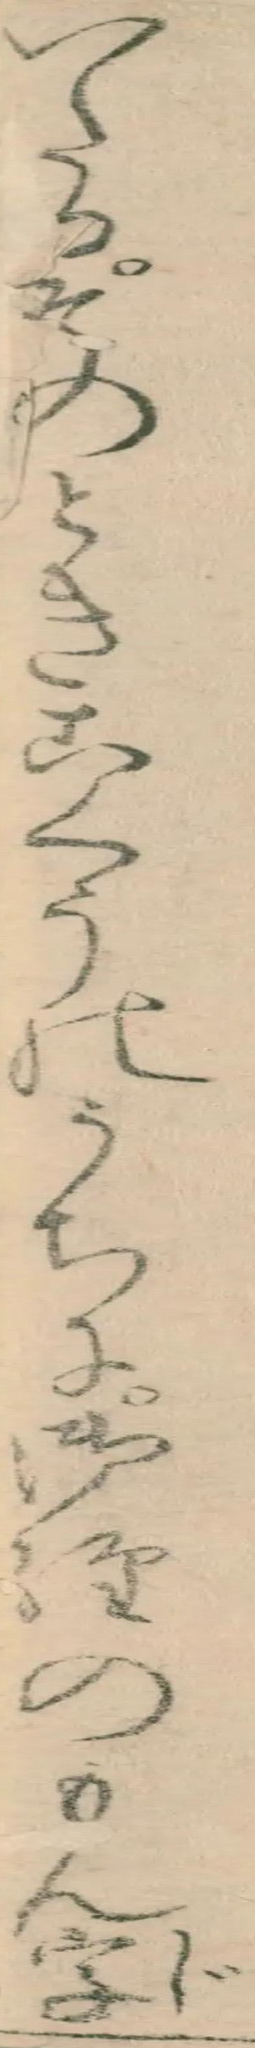いたる。そのときこくうのうちに。御経のもん字
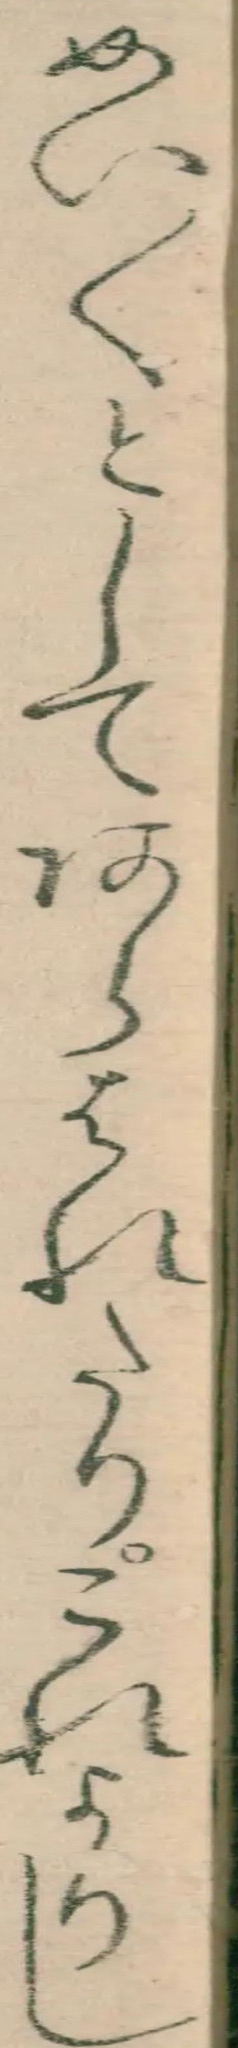めい〳〵としてあらはれたり。これよりし
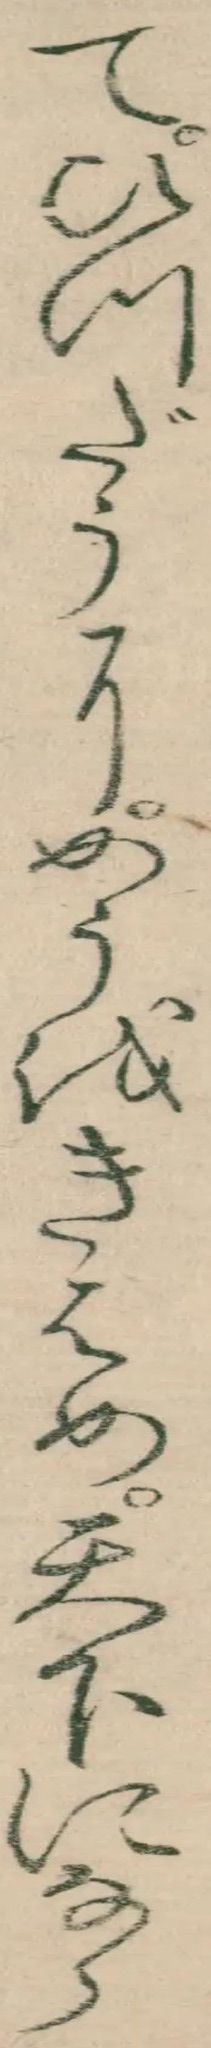て。ひつだうに。めうをきはめ。天下になら
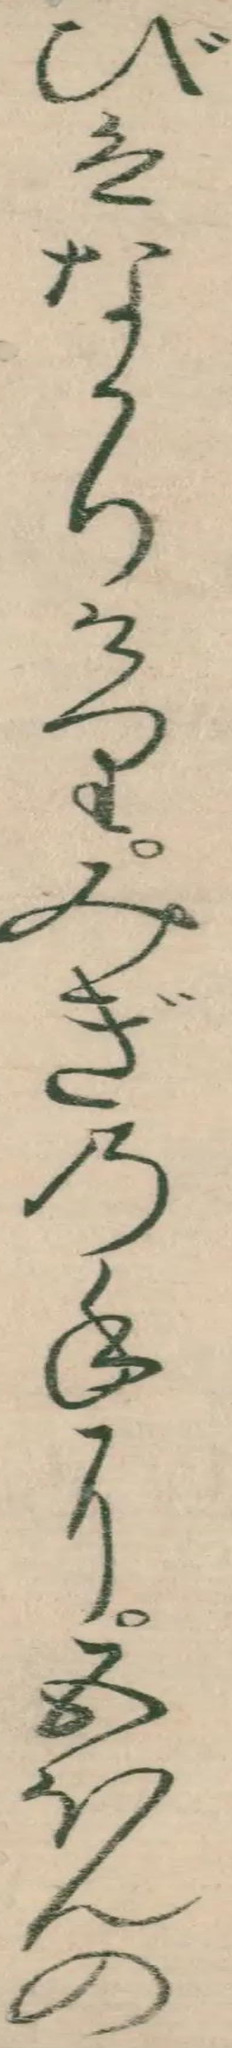びはなかりけり。みぎの手に。五ほんの
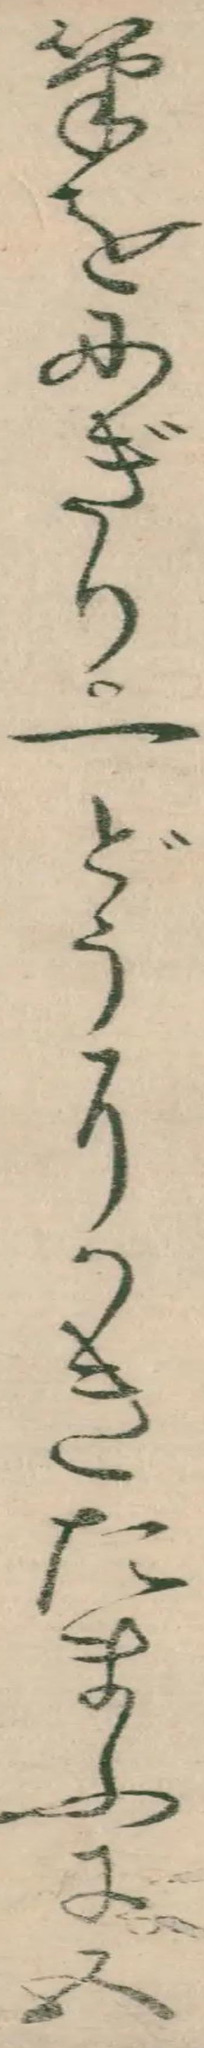筆をにぎり。一どうにかきたまふに五
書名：弘法大師御本地 3巻. [2]
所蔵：国立国会図書館 National Diet Library, JAPAN
